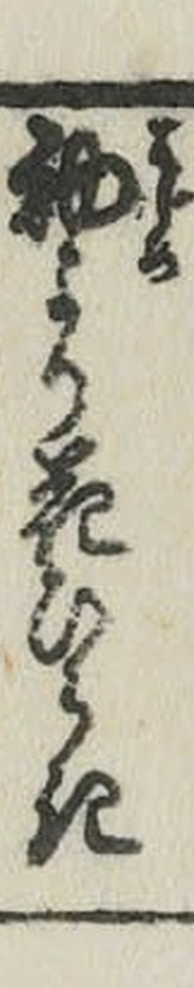初より花ひらき
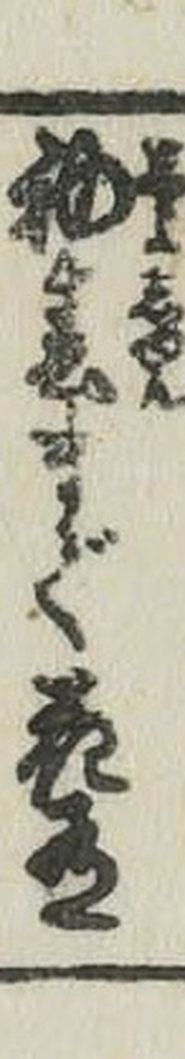初春まで花有
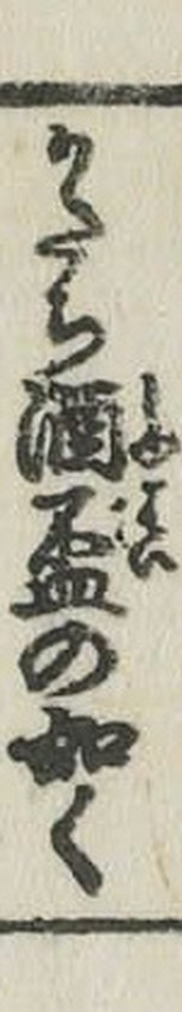かたち酒盃の如く
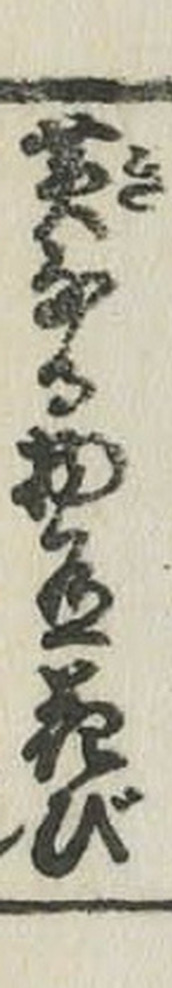黄なる物有花び
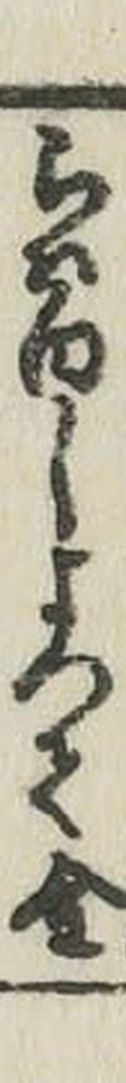らは白しよつて金
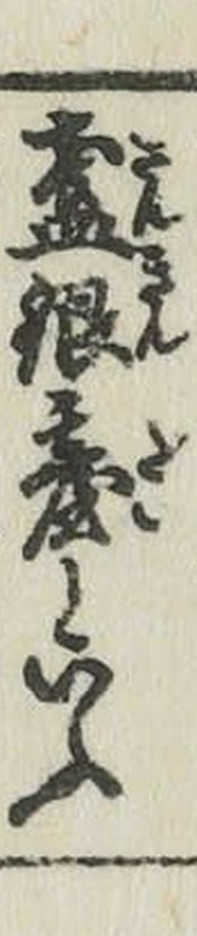盞銀台といふ
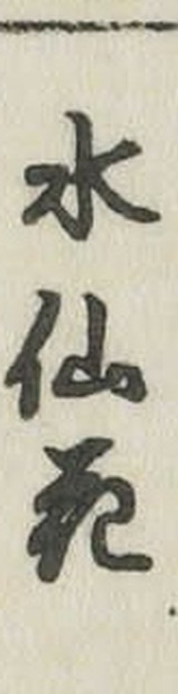水仙花
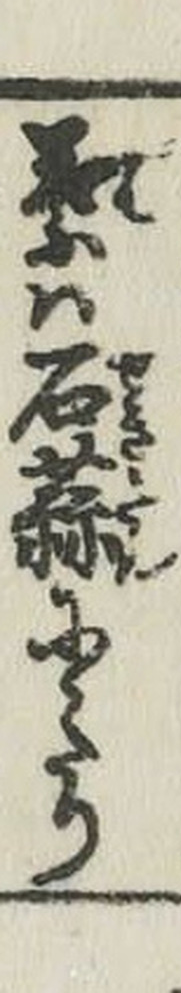葉は石蒜にゝたり
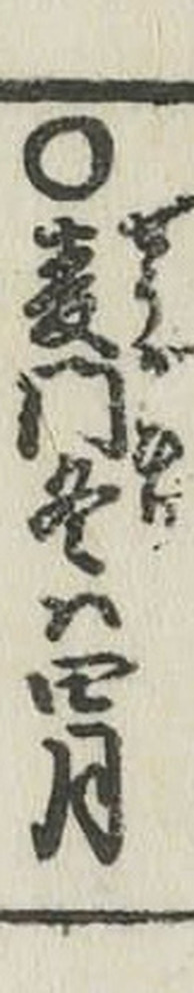○麦門冬は四月
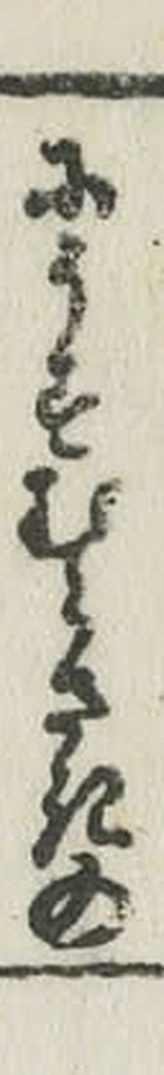にうすむらさきの
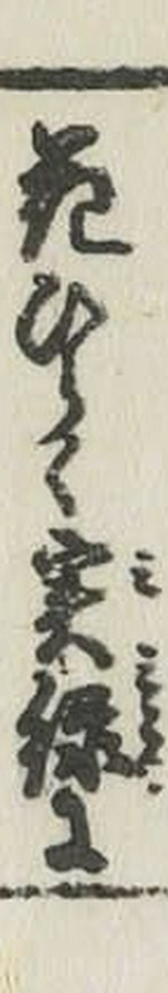花ひらく実緑に
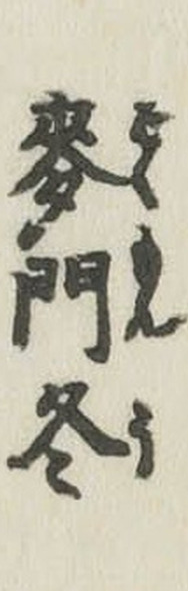麦門冬
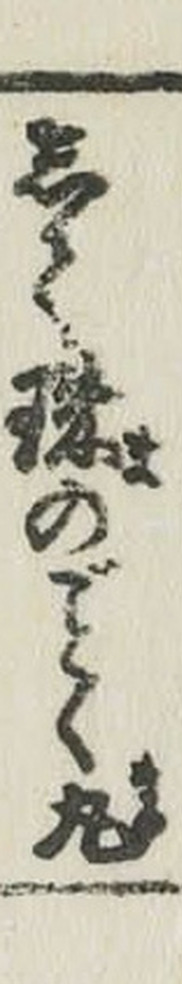して珠のごとく丸
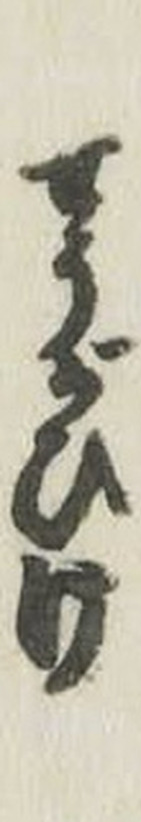せうがひけ
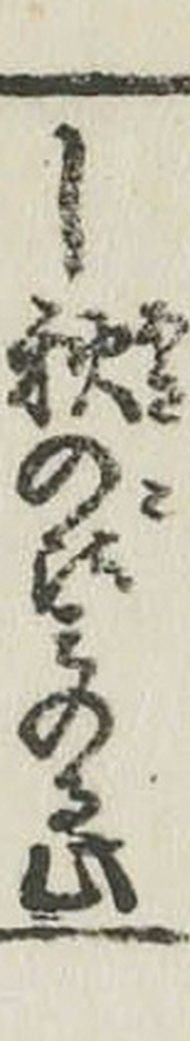し秋の頃みのる此
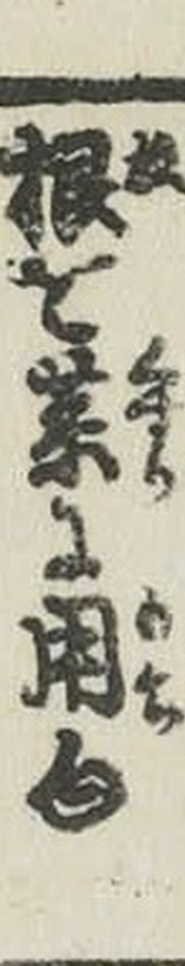根を薬に用ゆ
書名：増補頭書訓蒙図彙大成 10巻 9:巻之20
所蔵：東京学芸大学教育コンテンツアーカイブ
